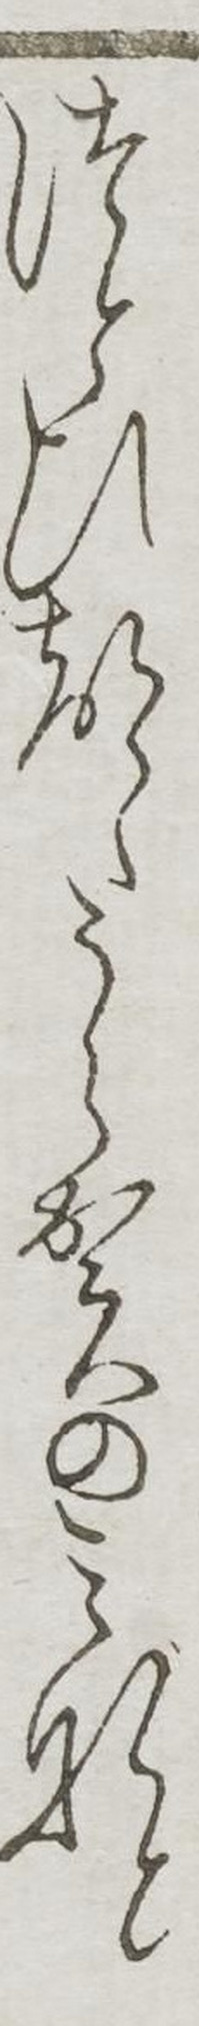つとひつゝうら賀のみなと
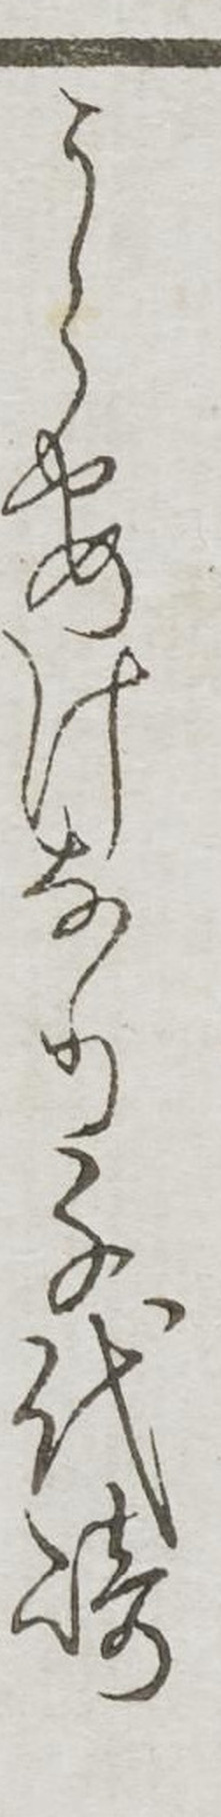うらあけなり千代崎
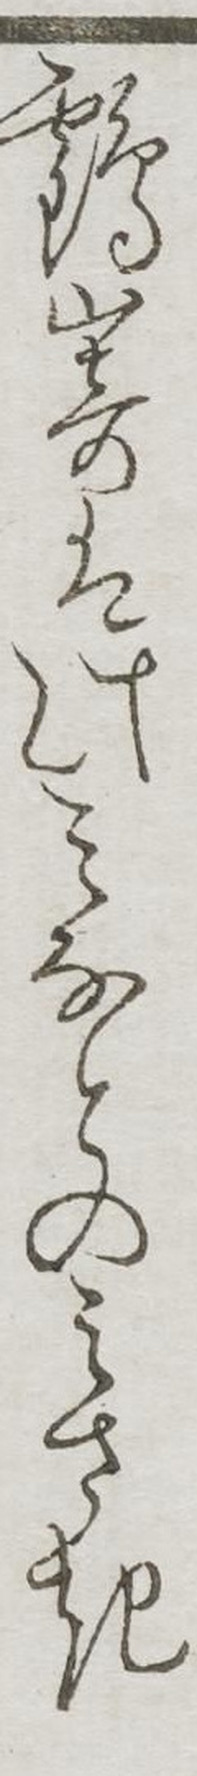鶴嵜は此みなとのみさき
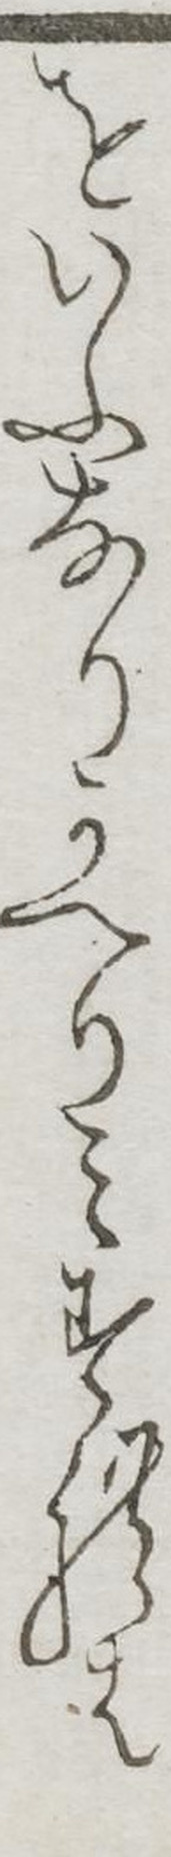をいふなりかへりみすれは
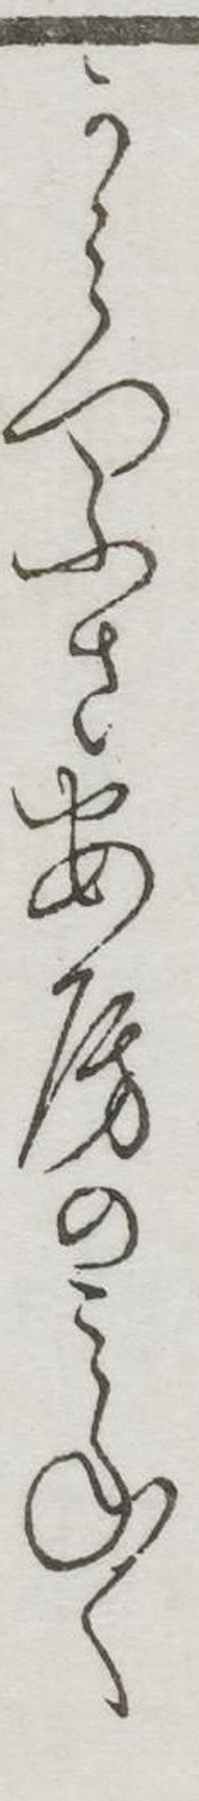かみつふさ安房のみね〳〵
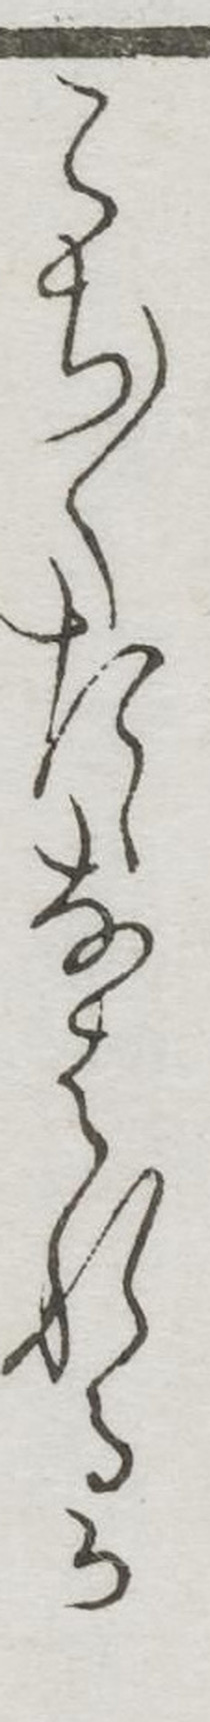こち〳〵たゝなはれるか
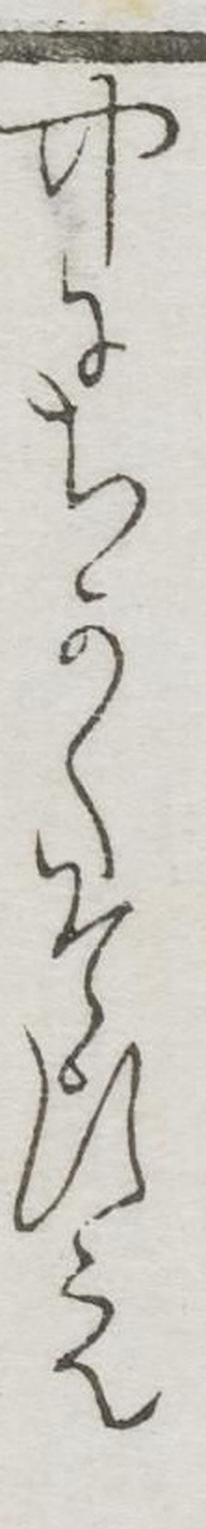中にちかくそひえ
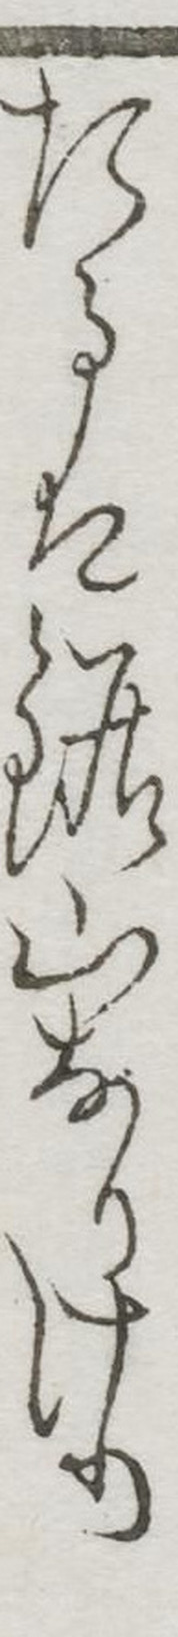たるは鋸山なりけり
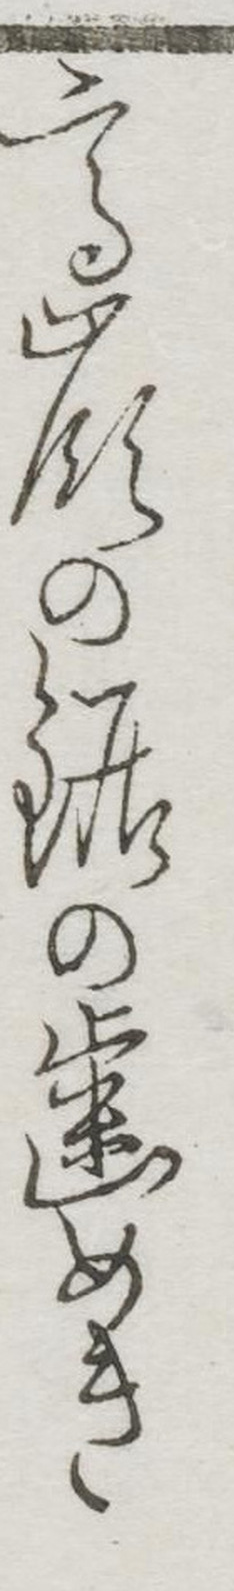高嶺の鋸の歯めき
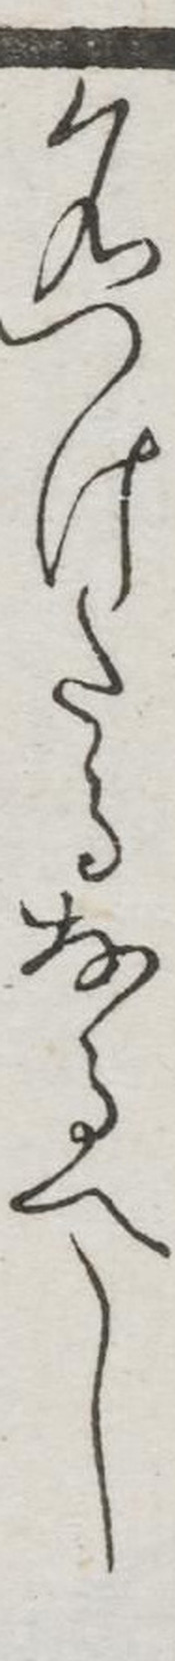名つけたるなるへし
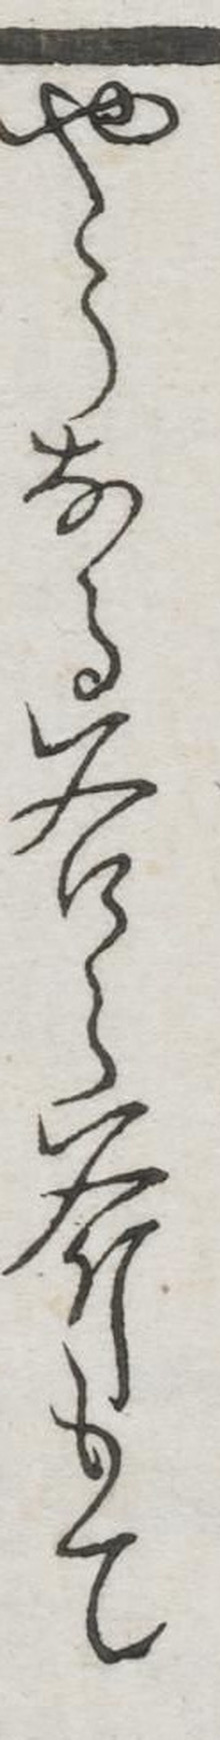やうなる谷々斧もて
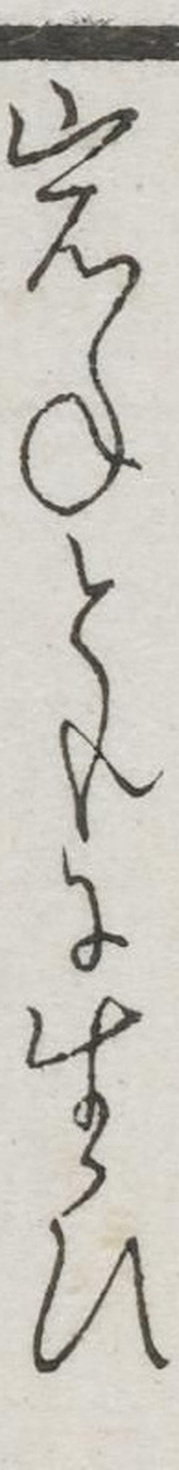岩ねともに生ひ
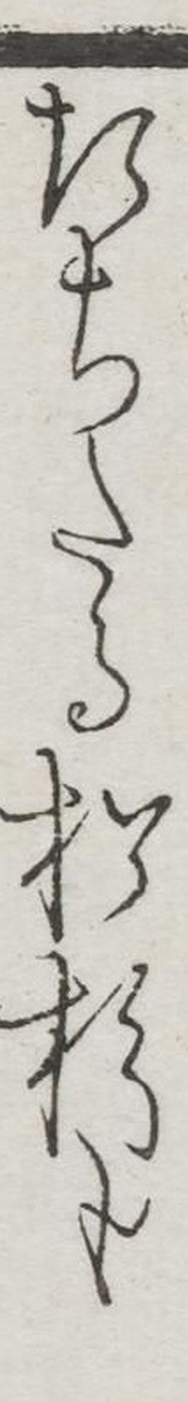たちたる松杉も
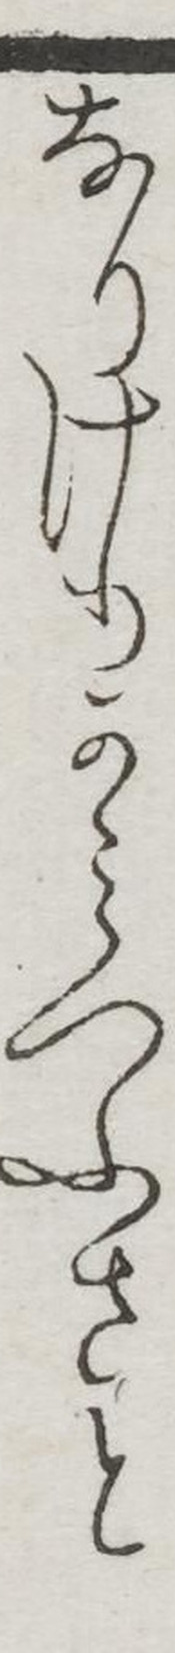なりけりかみつふさと
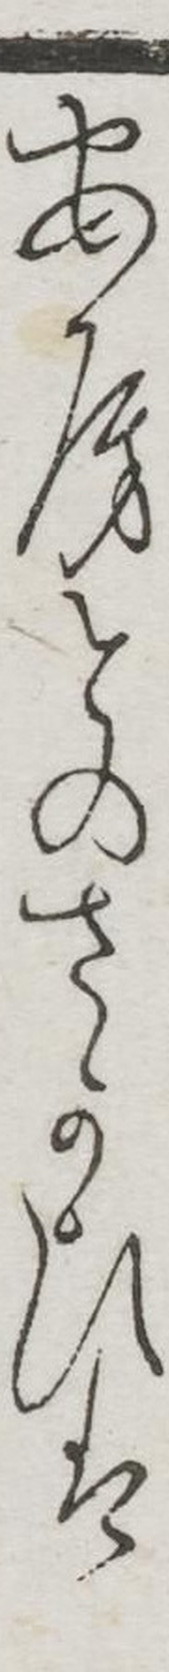安房とのさかひは
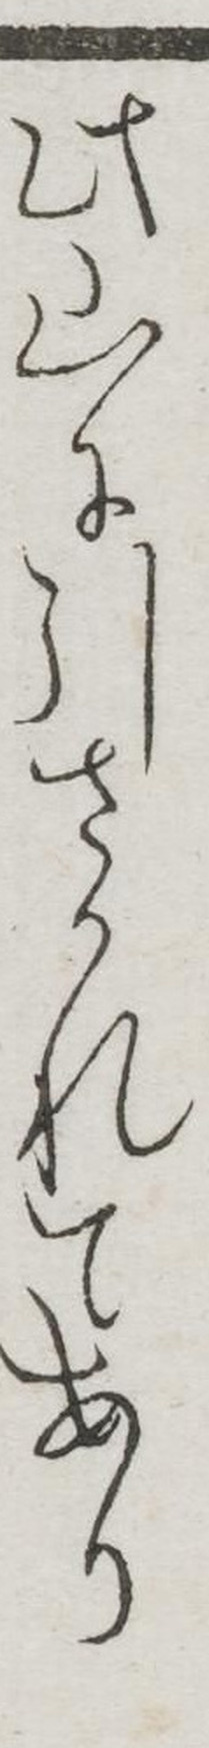此山に引さかれてあり
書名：挿画熱海日記　全
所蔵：東京大学地震研究所図書室 Earthquake Research Institute Library, The University of Tokyo, JAPAN
